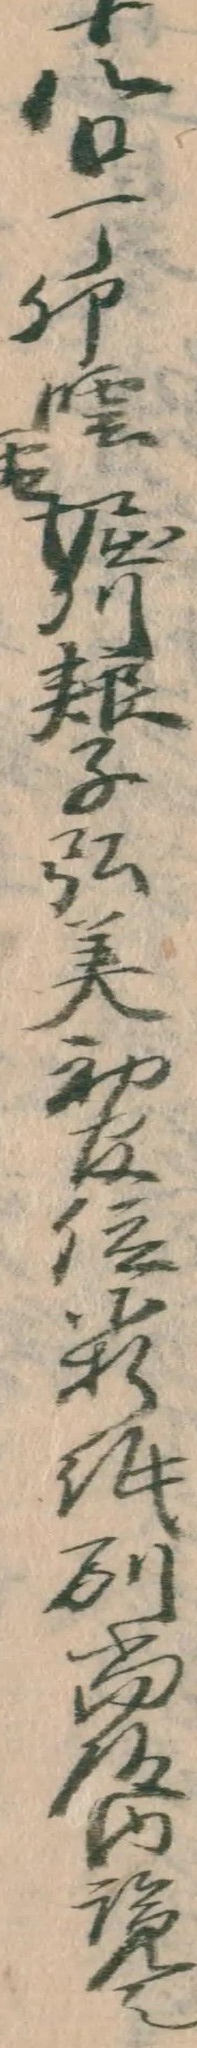十八日丁卯曇り雷堀川養子弘美初官位小折紙別當殿内覧之
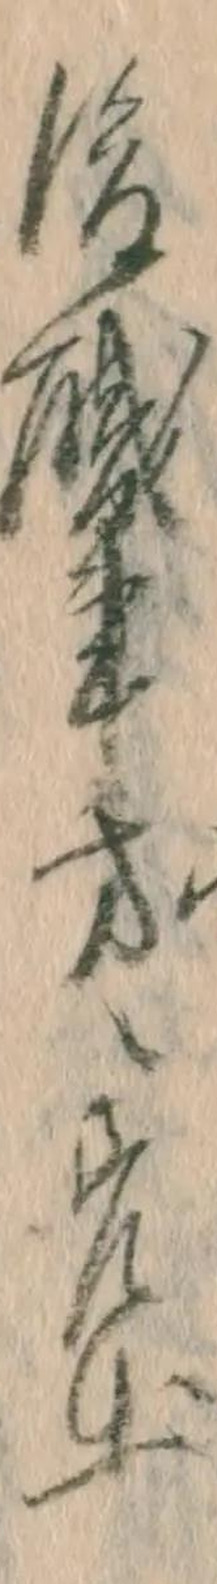後職事方へ差出
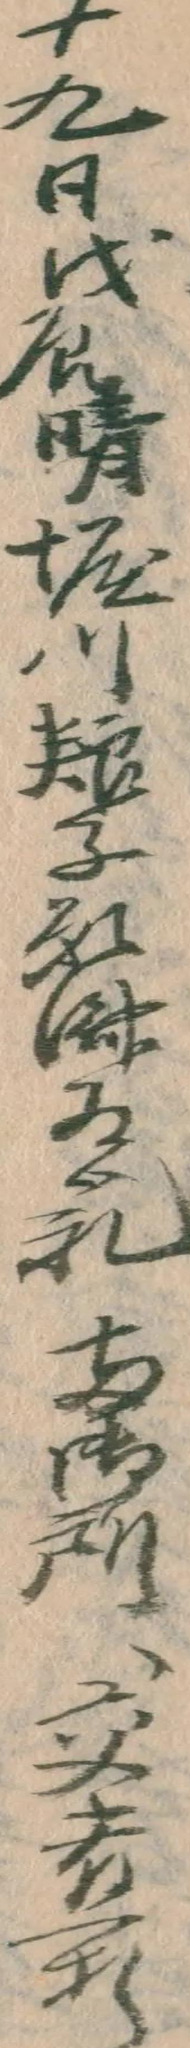十九日戊辰晴堀川養子相済為御礼両御所へ交肴一折
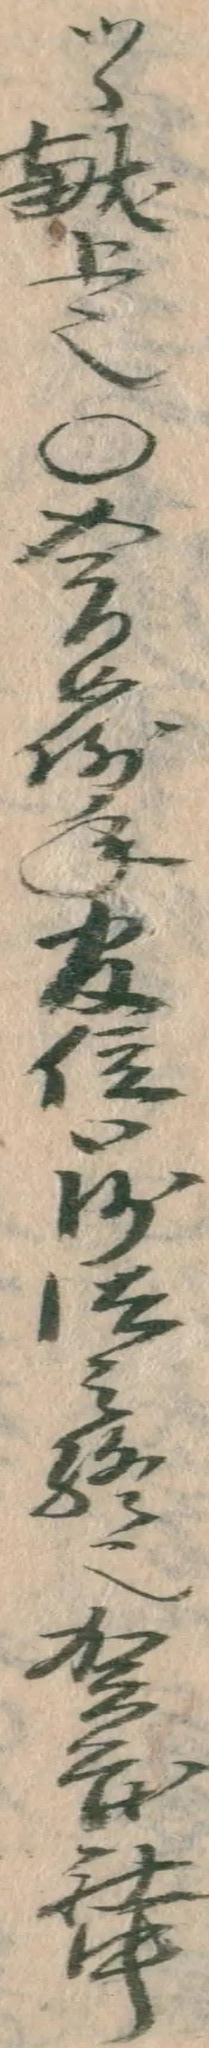ツヽ献上也○今日如例年官位御沙汰之終也賀茂社中
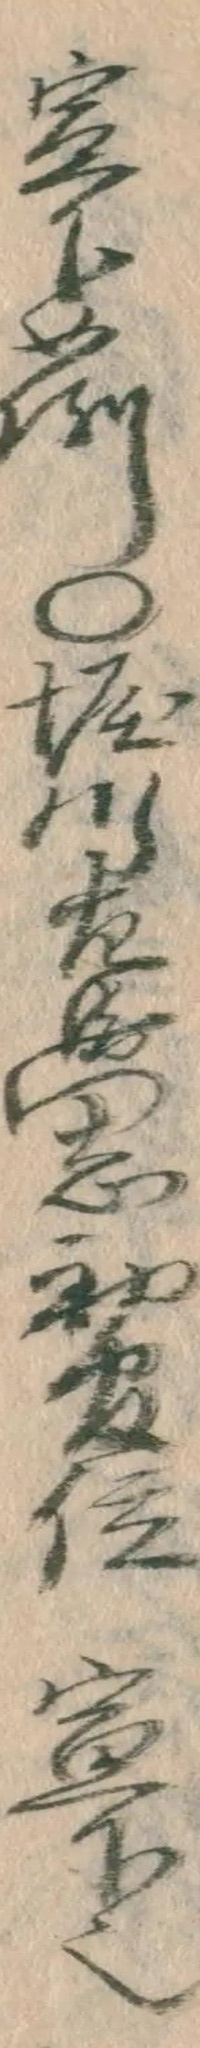宣下如例〇堀川左衛門志初官位宣下也
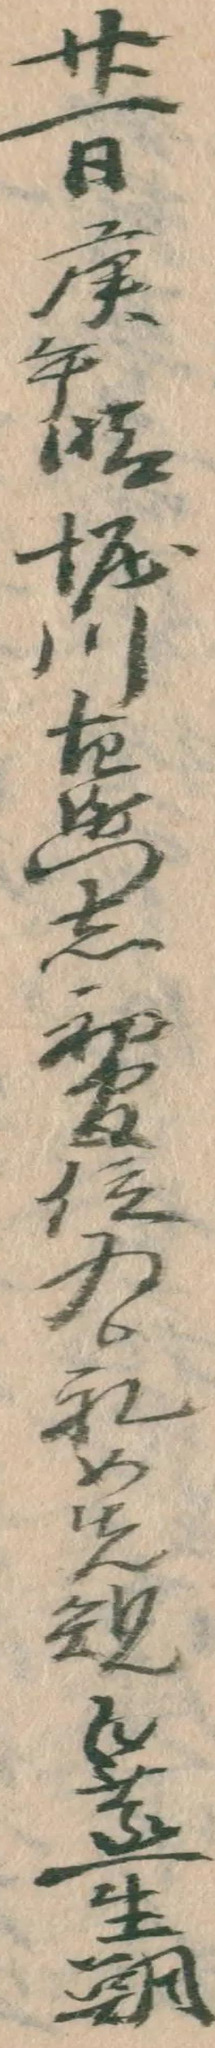廿一日庚午晴堀川左衛門志初官位為御礼如先規白蒸生鯛
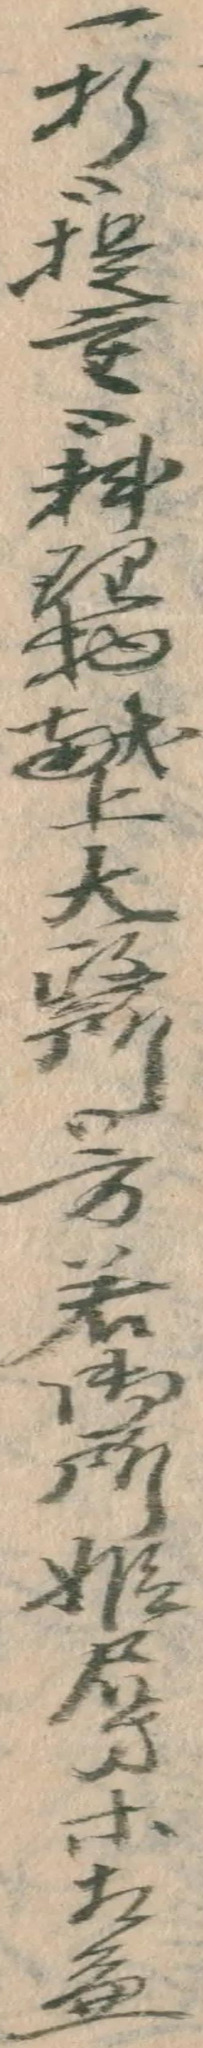一折御提重御料理物献上大政所御方若御所姫君方等相兼
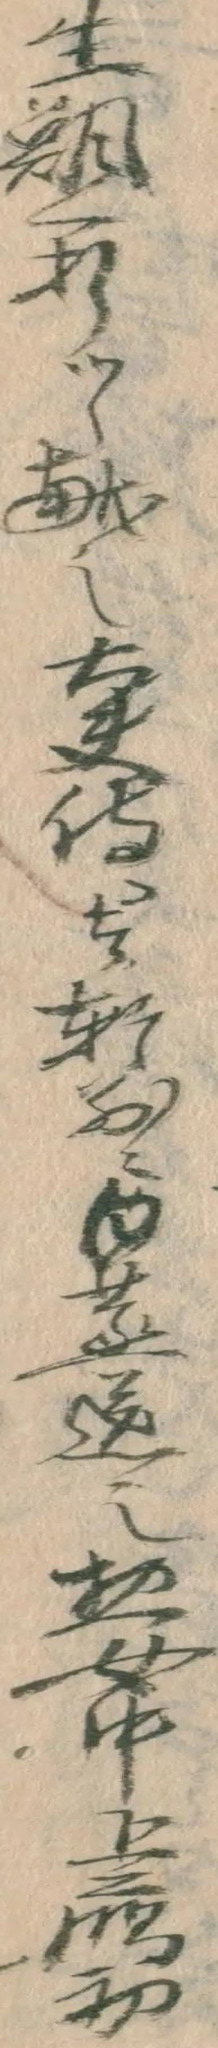生鯛一折ツヽ献之大夫侍へは軒前に白蒸通也惣女中上臈初
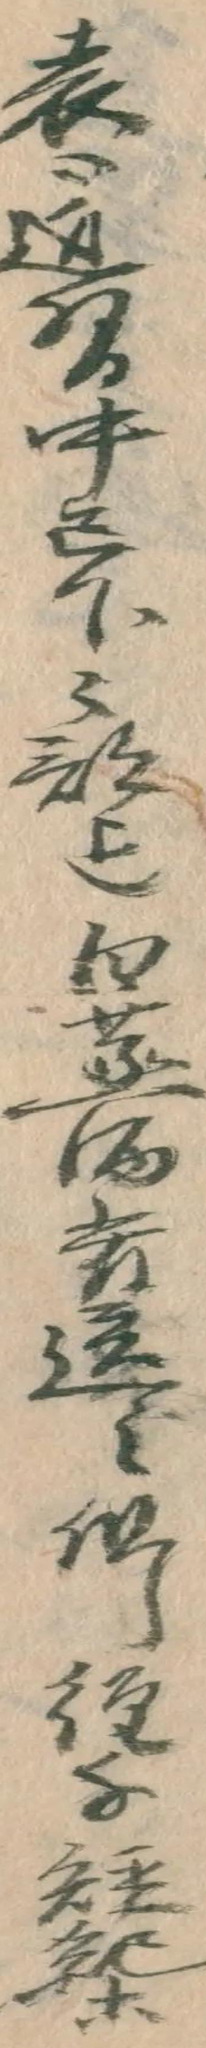表御近習中已下々部迄白蒸一酒肴送之但し経千経紀等
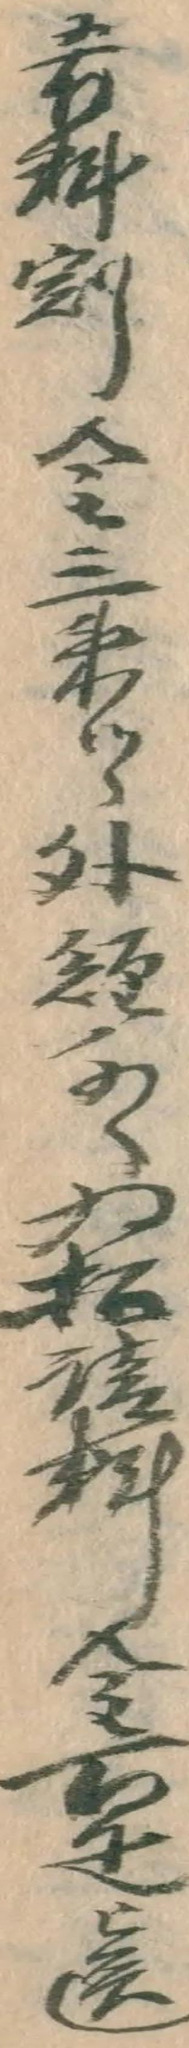肴料割金三朱ツヽ外経千ヘ為招請料金百疋被送

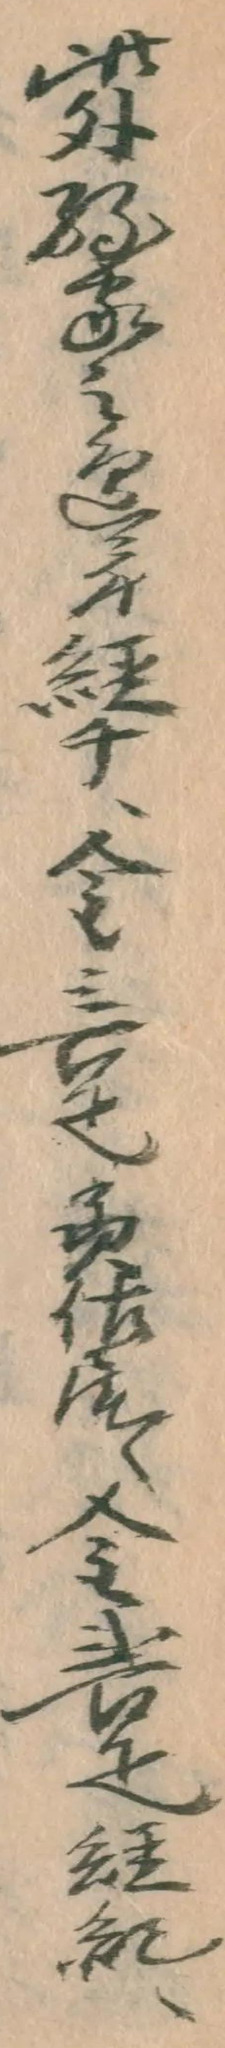此外縁家之邊ニ付経千へ金三百疋美佐尾へ金弐百疋鮭紀へ
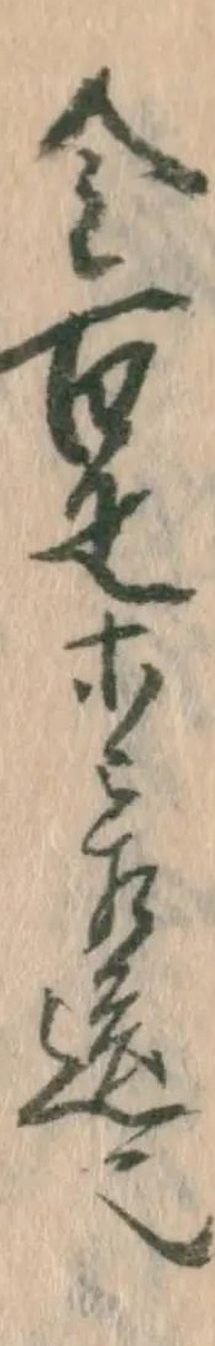金百疋等被相送也
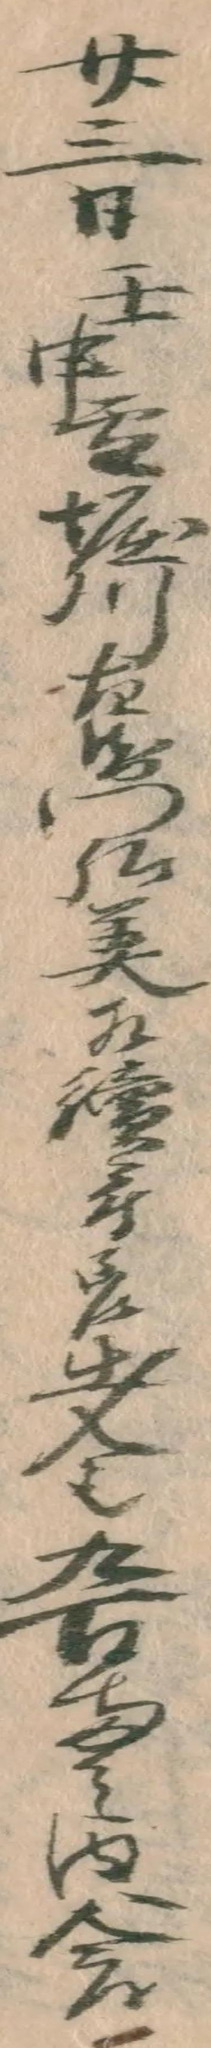廿三日壬申堀川左衛門弘美相續ニ付差出入之九百両之内へ今日
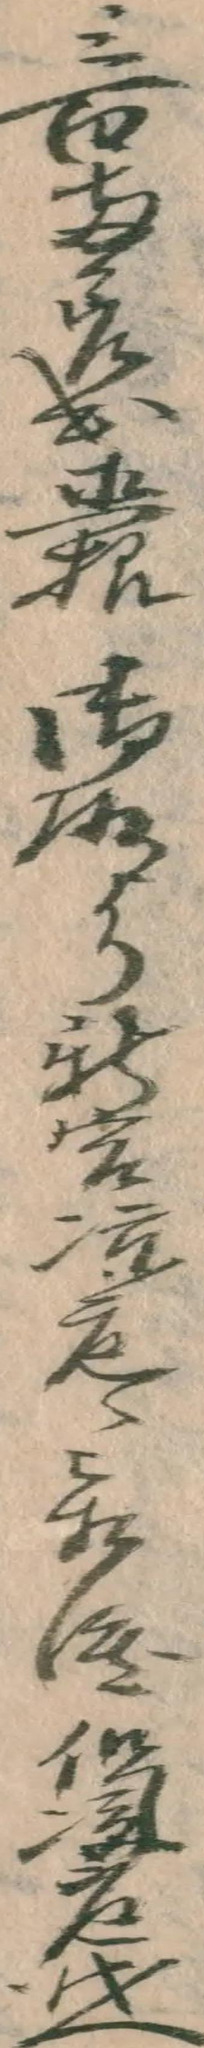三百両差出直様御殿より新宮涼庭へ被相渡但涼庭代へ
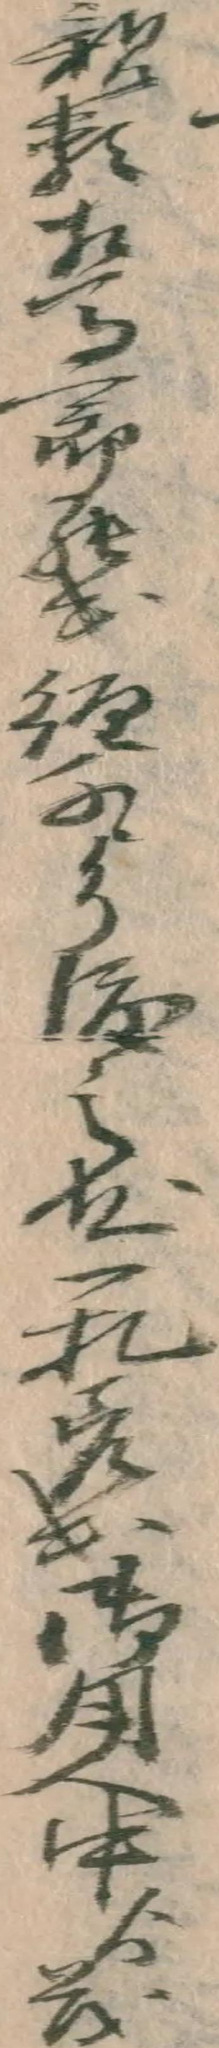親類相馬一郎罷出経千より渡之尤一札差出御用人中ゟ茂
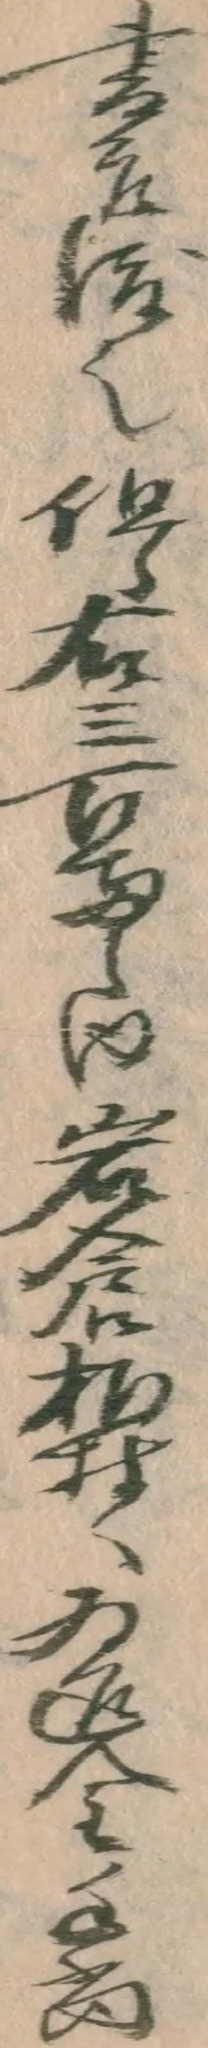書付渡也但し右三百両之内岩倉柏村へ為返金手當
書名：賀茂社記録. 第67冊
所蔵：国立国会図書館 National Diet Library, JAPAN
